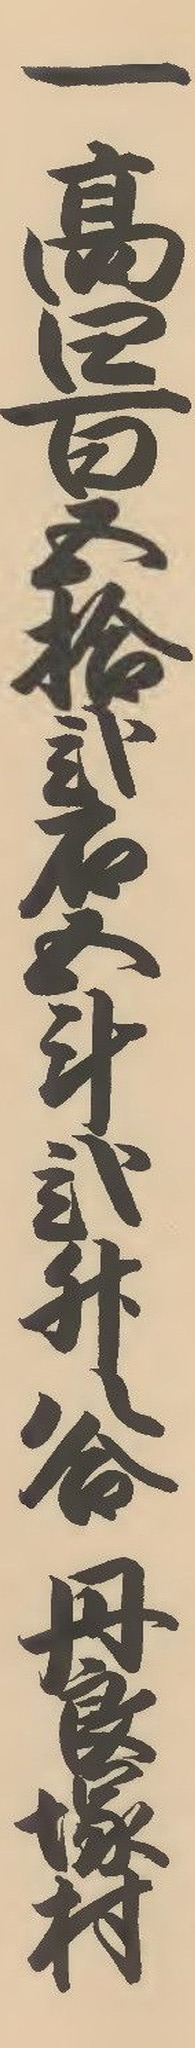一髙四百五拾弐石五斗弐升八合丹良塚村
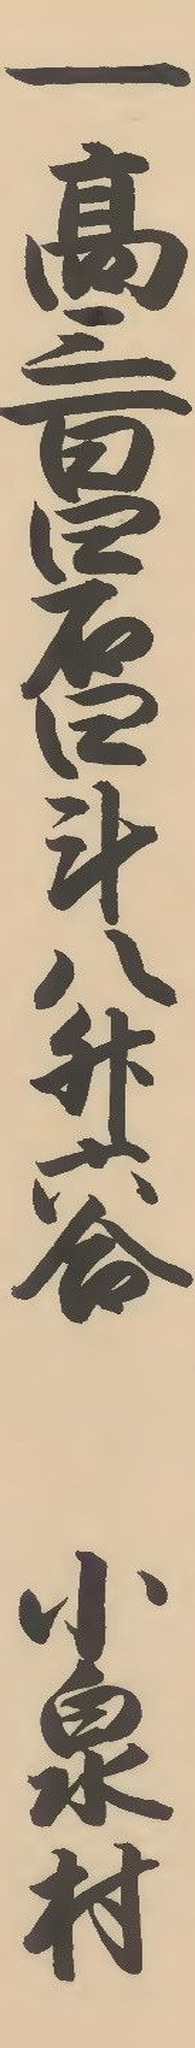一髙三百四石四斗八升六合小泉村
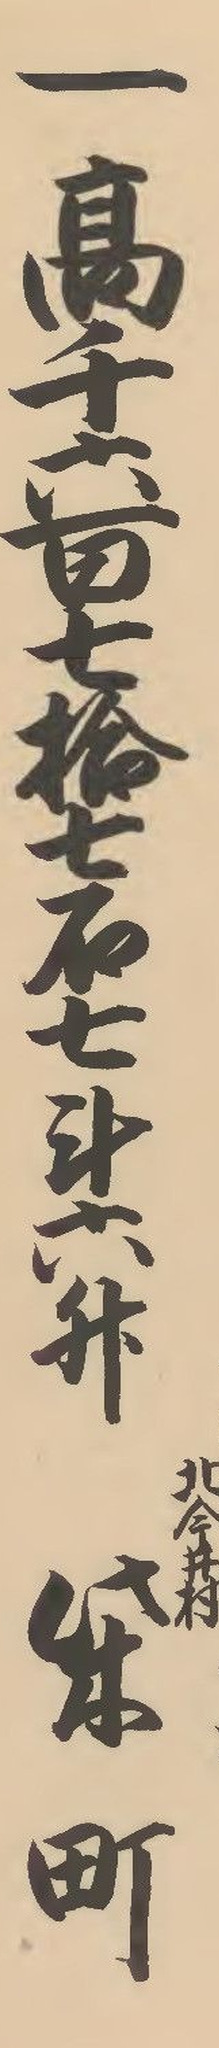一髙千六百七拾七石七斗六升柴町

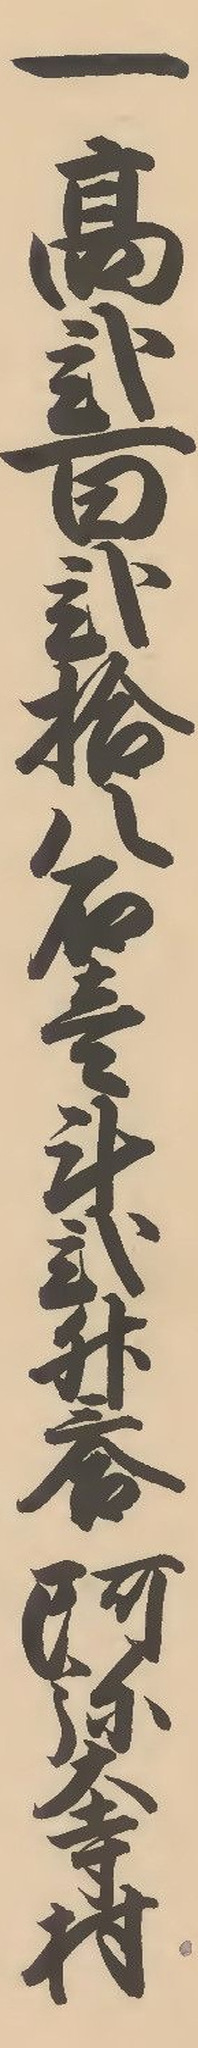一髙弐百弐拾八石壱斗弐升三合阿弥大寺村
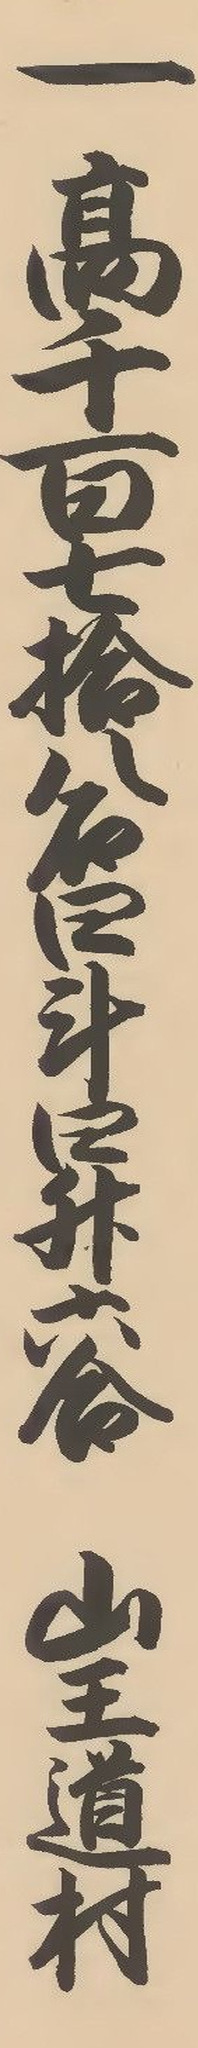一髙千百七拾八石四斗四升六合山王道村
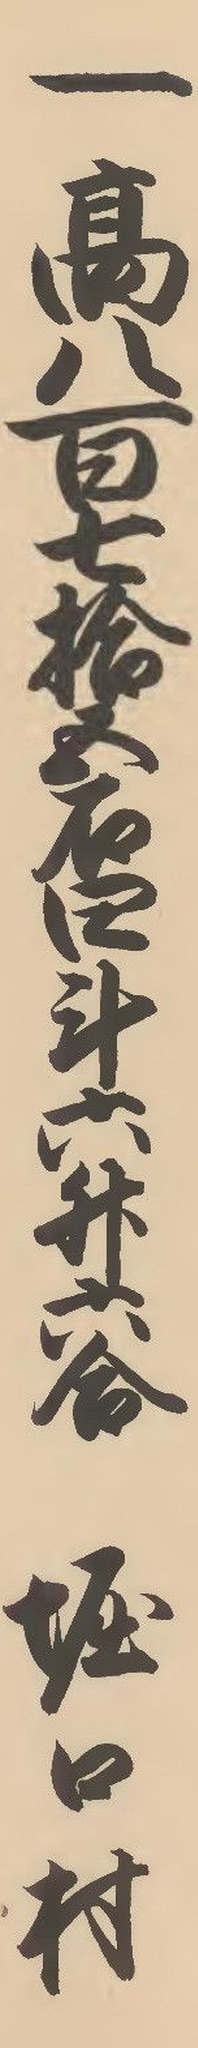一髙八百七拾五石四斗六升六合堀口村
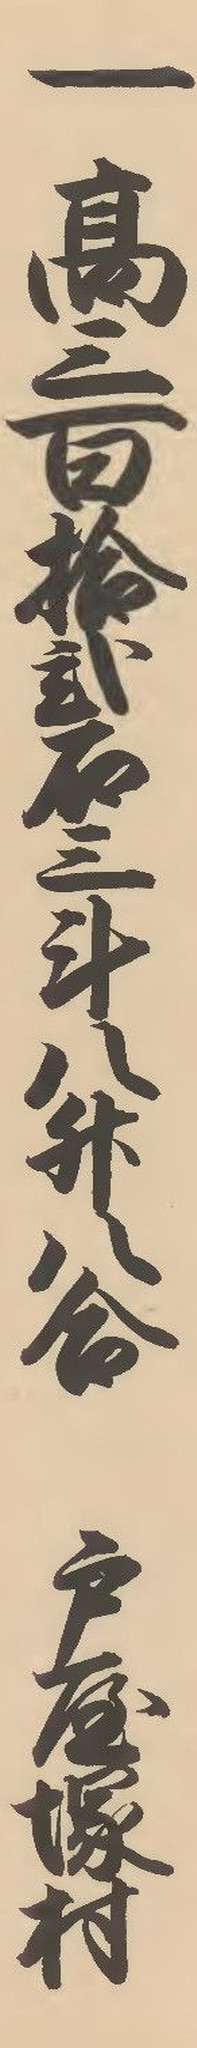一髙三百拾弐石三斗八升八合戸屋塚村
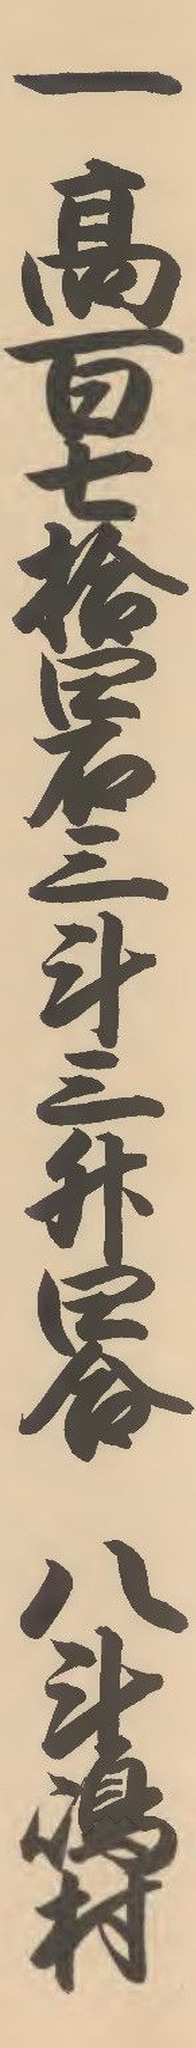一髙百七拾四石三斗三升四合八斗嶋村
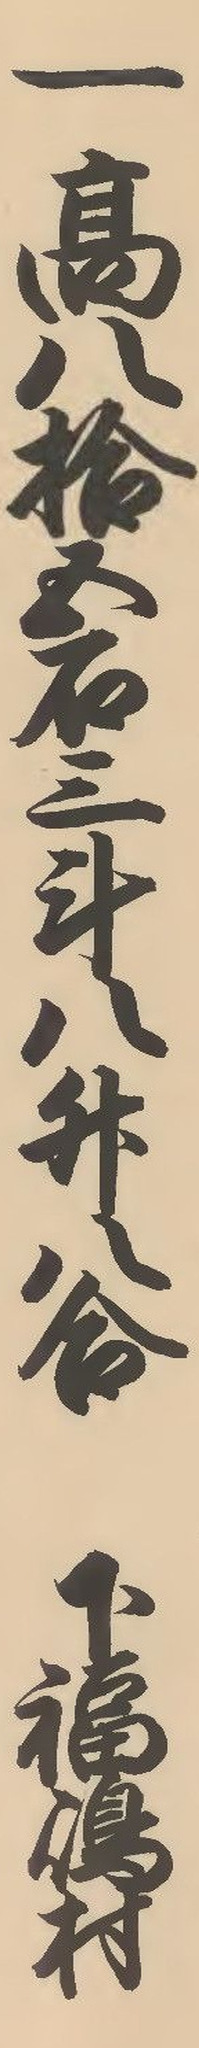一髙八拾五石三斗八升八合下福嶋村
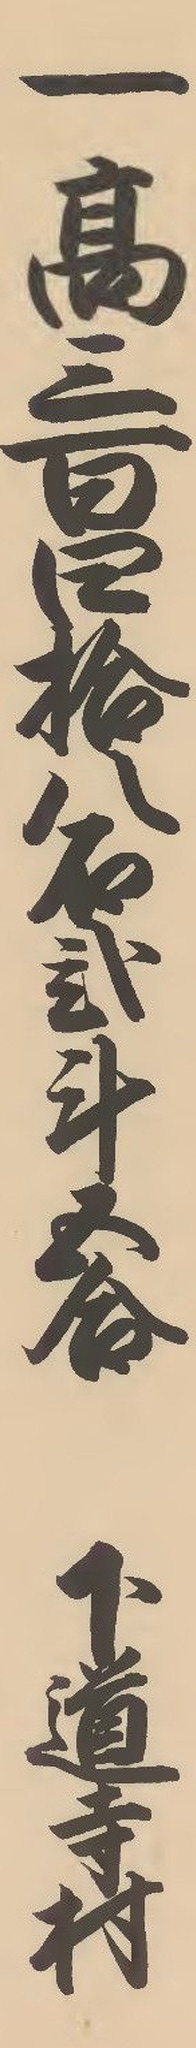一髙三百四拾八石弐斗五合下道寺村
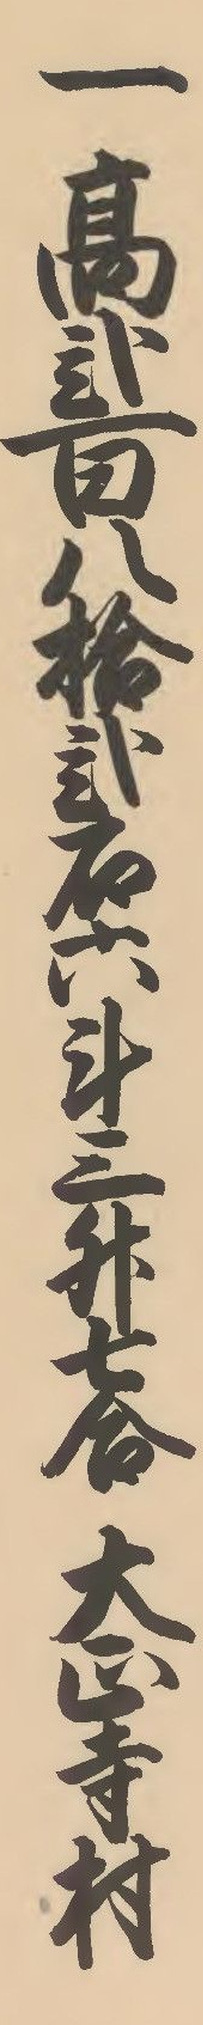一髙弐百八拾弐石六斗三升七合大正寺村

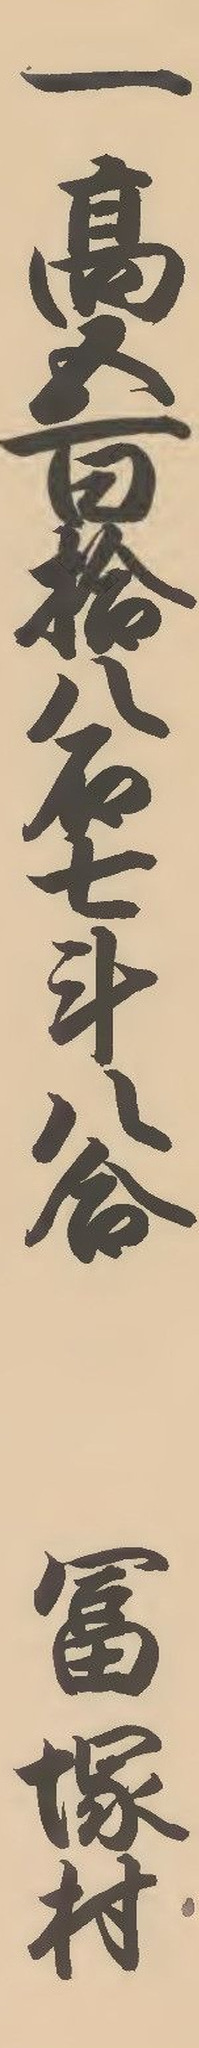一髙五百拾八石七斗八合冨塚村
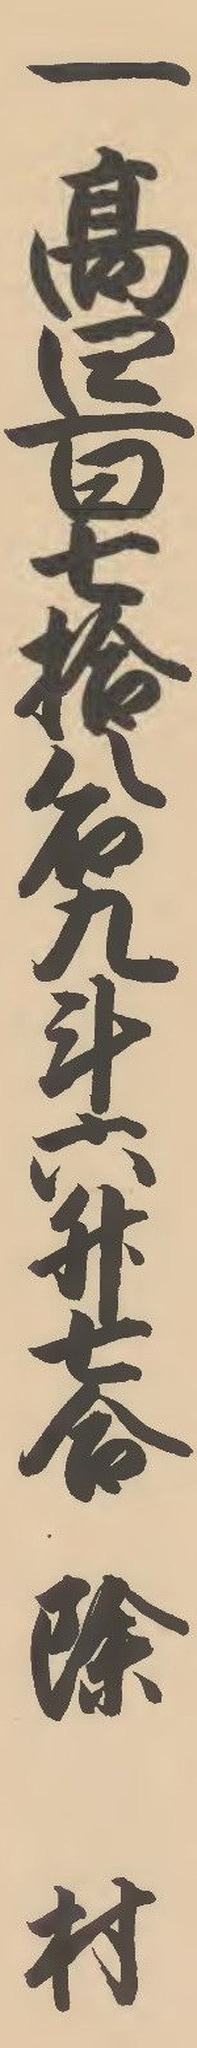一髙四百七拾八石九斗六升七合除村
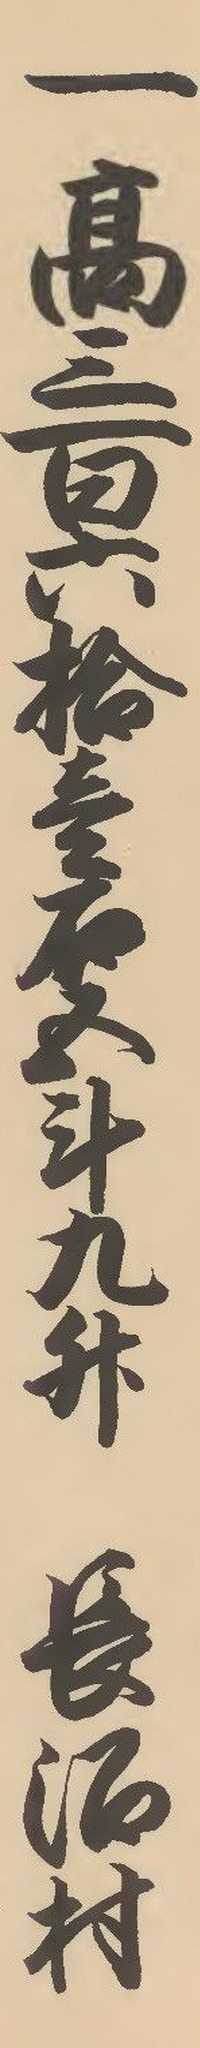一髙三百六拾壱石五斗九升長沼村
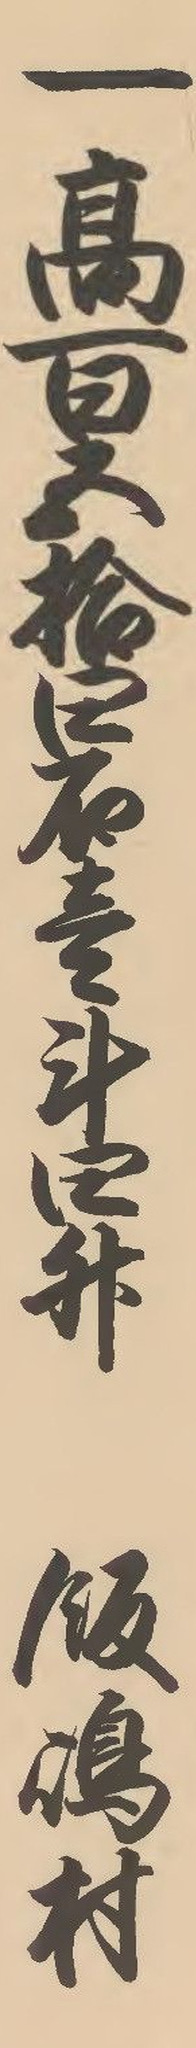一髙百五拾四石壱斗四升飯嶋村
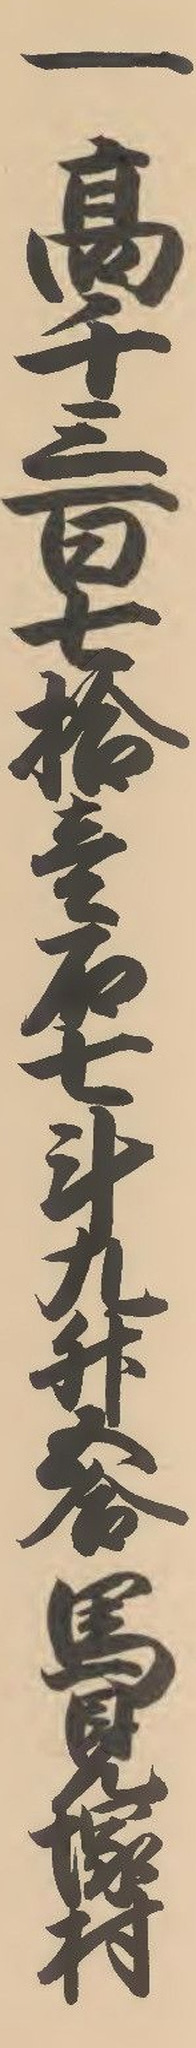一髙千三百七拾壱石七斗九升五合馬見塚村
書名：上野国郷帳
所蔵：国立公文書館 National Archives of Japan
